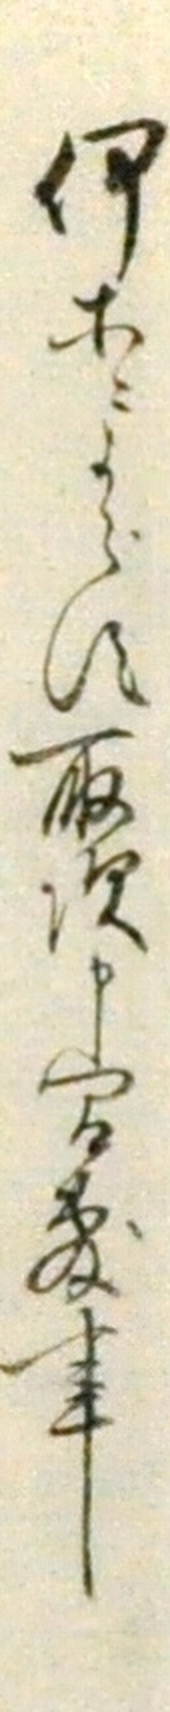何等ニよらす取次申間敷事
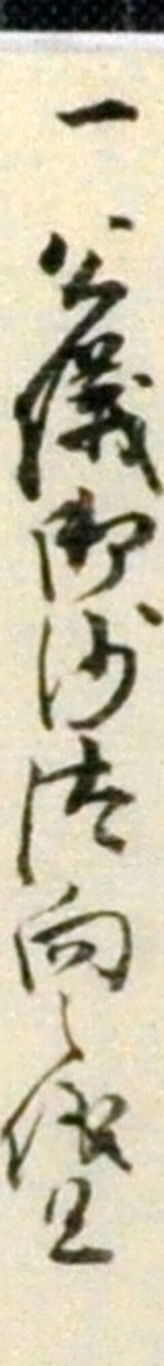一公儀御沙汰向之儀且
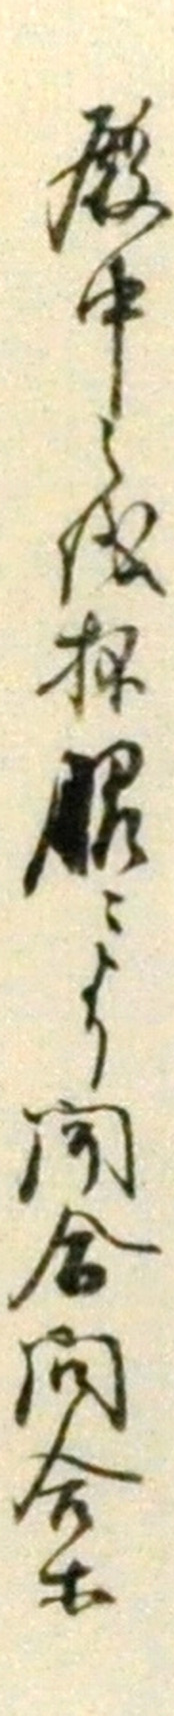殿中之儀抔脇ニより聞合問合等
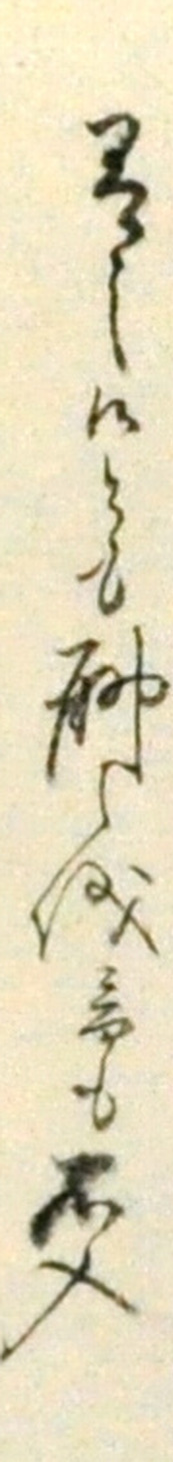有之候とも聊之儀ニ而も不入
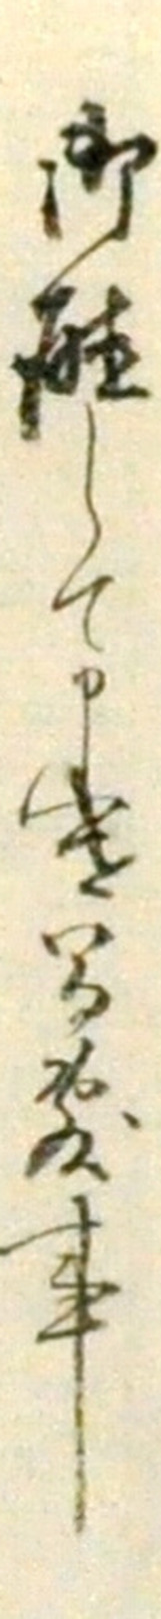御聴して申遣候間敷事
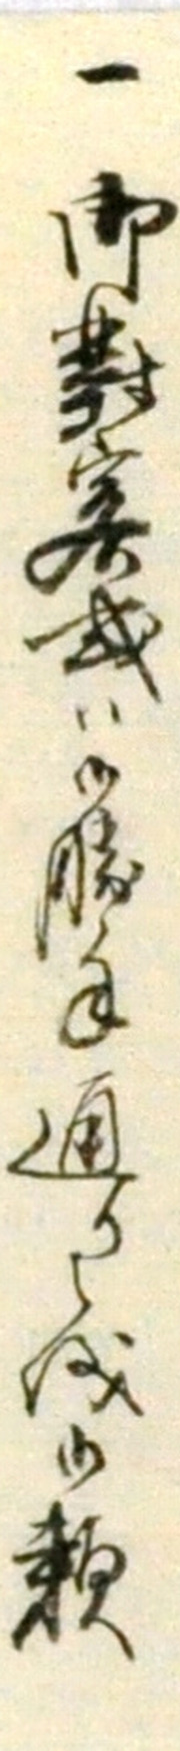一御対客或ハ御勝手通り之儀御頼
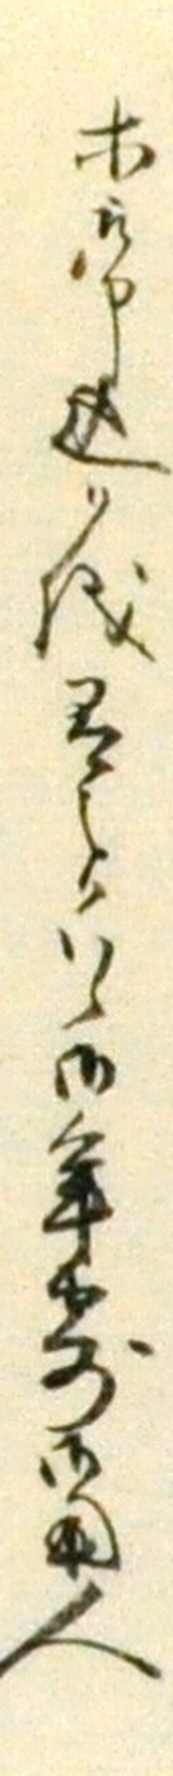等被申込候儀有之候ハヽ御年寄御用人
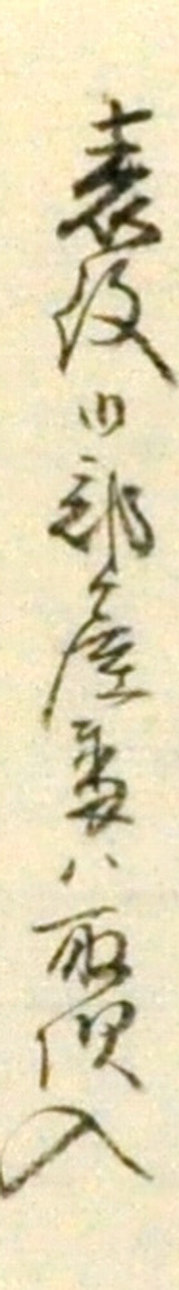表役御部屋番ハ取次入
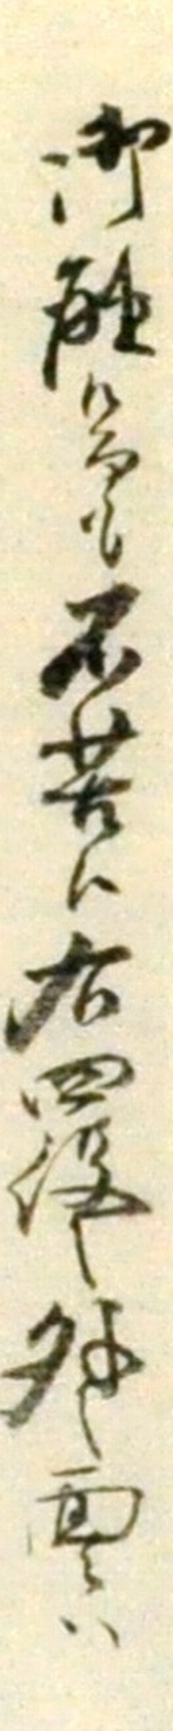御聴候而も不苦候右四役之外之面々ハ
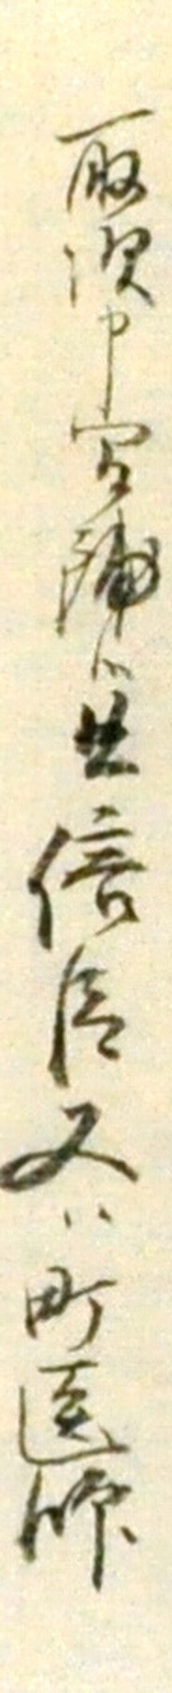取次申間鋪候共倍臣又ハ町医師
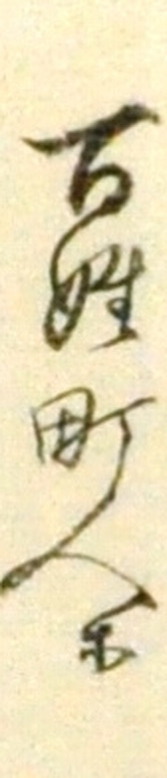百姓町人等
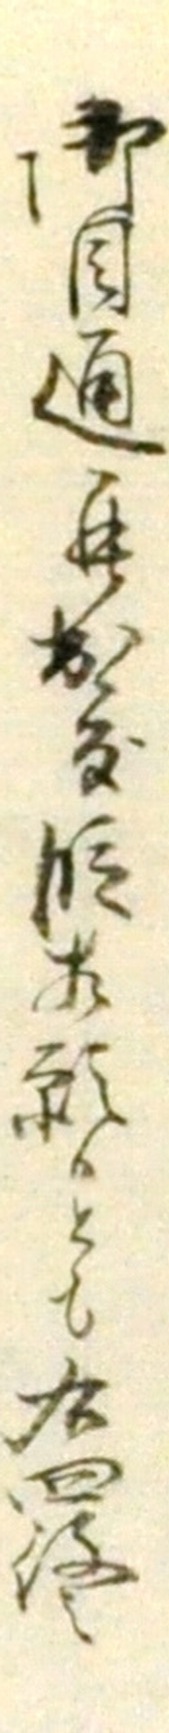御目通罷出度段相願候とも右四役之
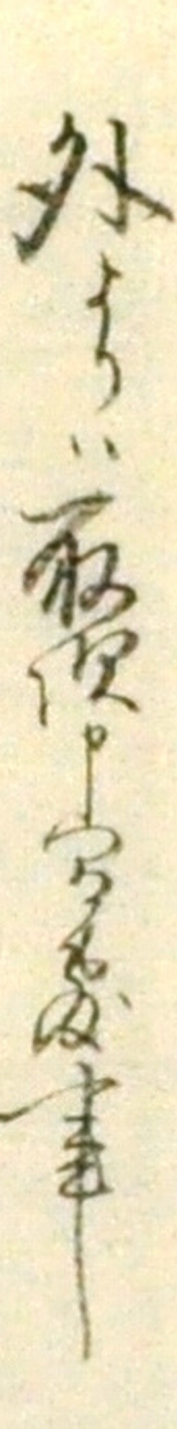外よりハ取次申間敷事
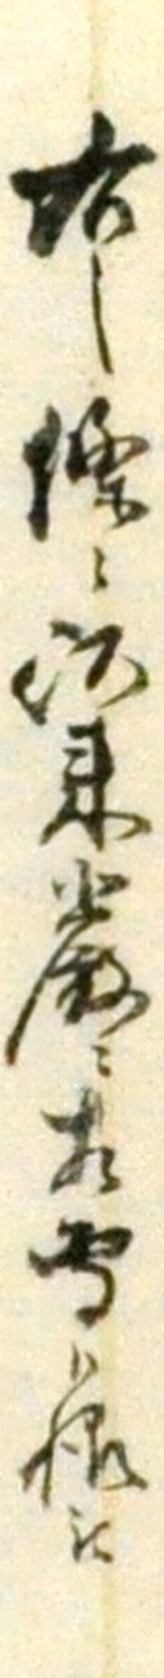右之條々以来厳ニ相守候様被
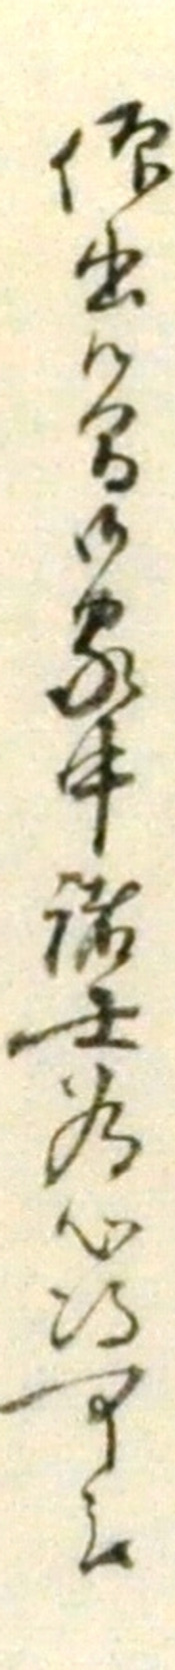仰出候間御家中諸士為心得可被
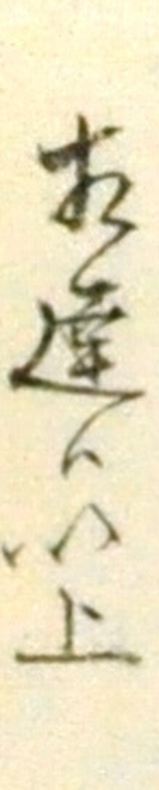相達候以上
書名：家中触
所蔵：伊那市立高遠町図書館・合同会社AMANE
